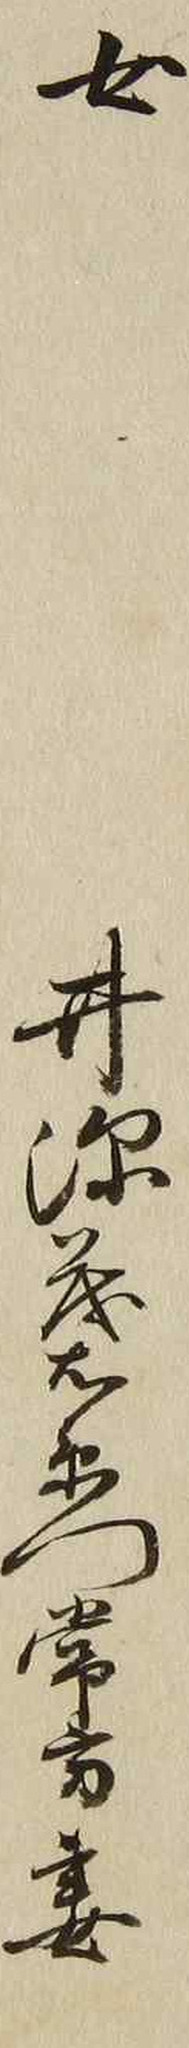女井深茂右衛門常方妻
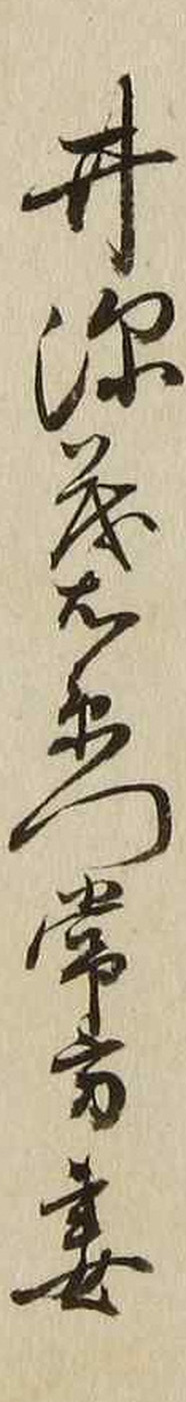女井深茂右衛門常方妻
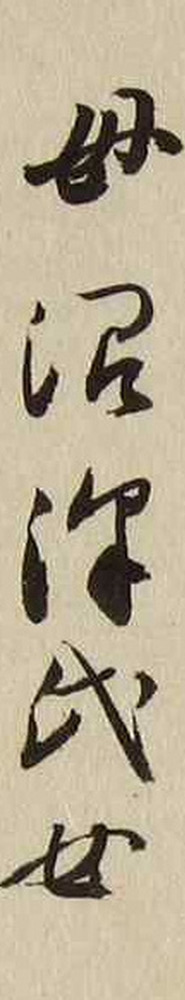母沼沢氏女

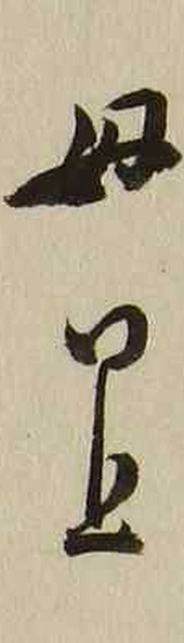母同上
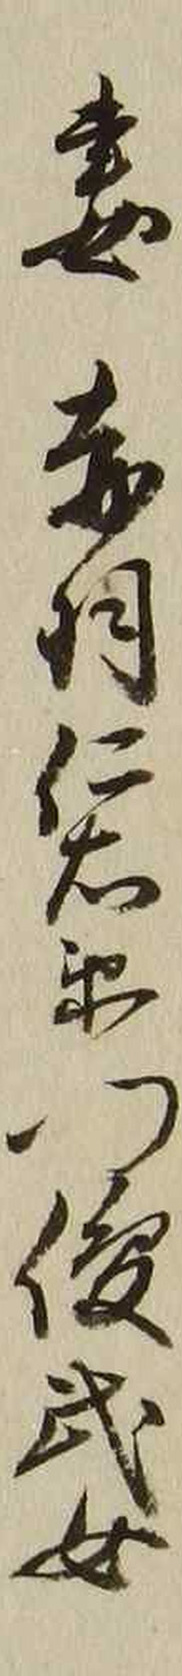妻赤羽仁右衛門俊武女
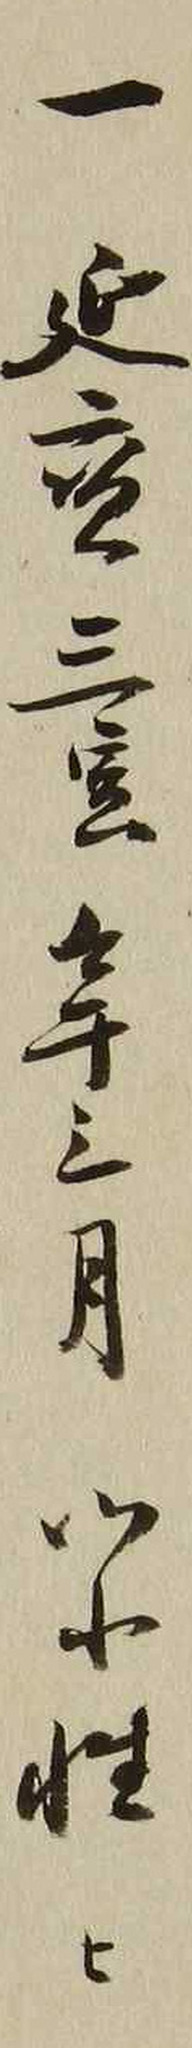一延宝三寅年三月御小性被
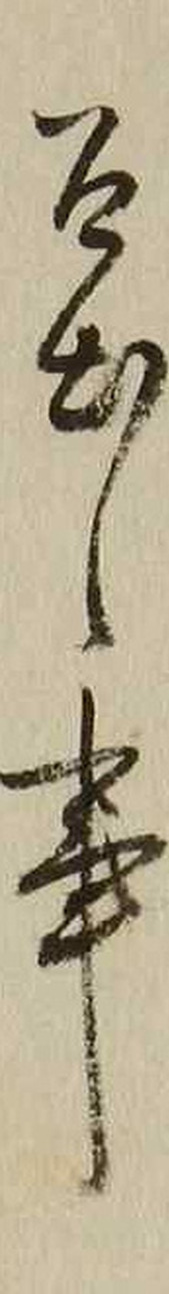召出候事
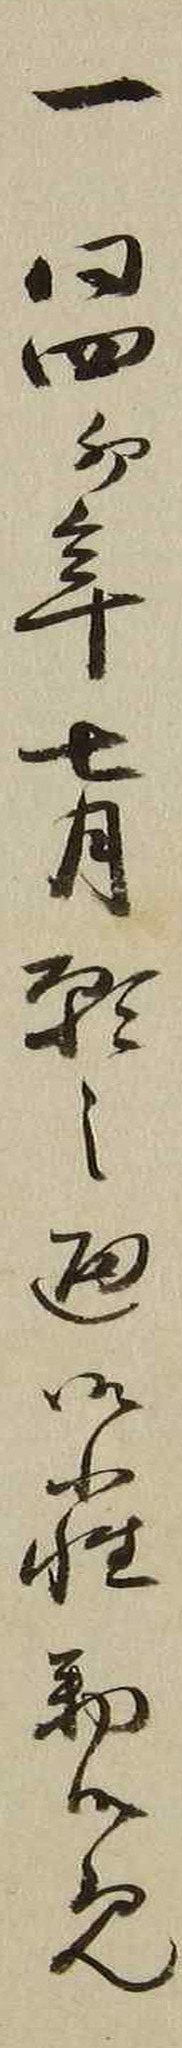一同四卯年願之通御小性勤御免
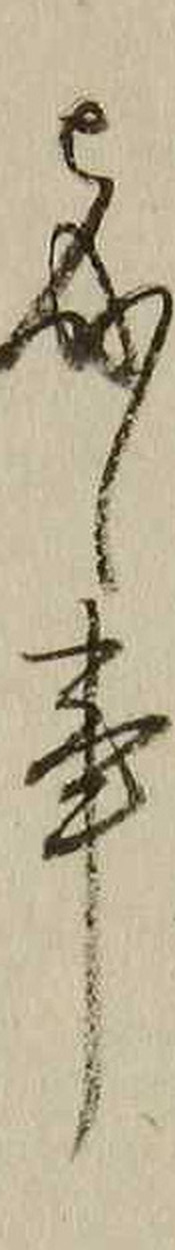被成候事
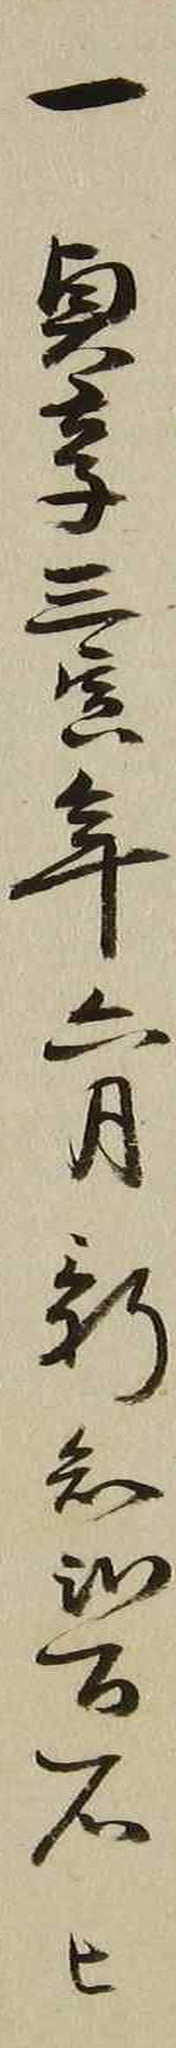一貞享三寅年六月新知弐百石被
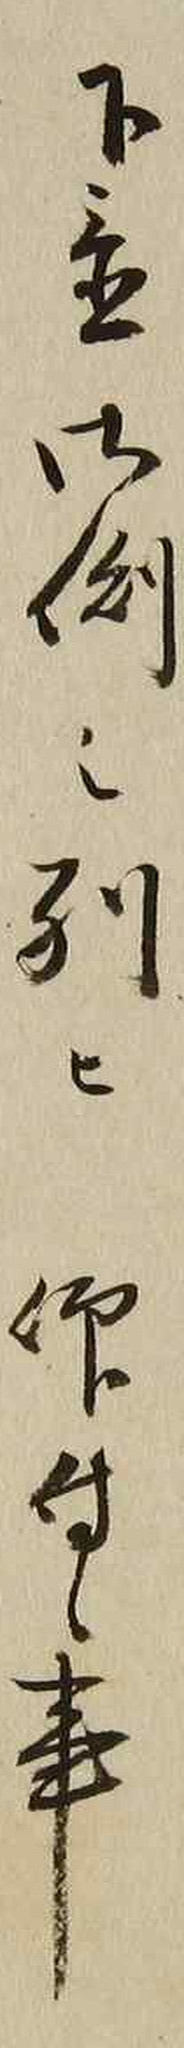下置御側之列被仰付候事
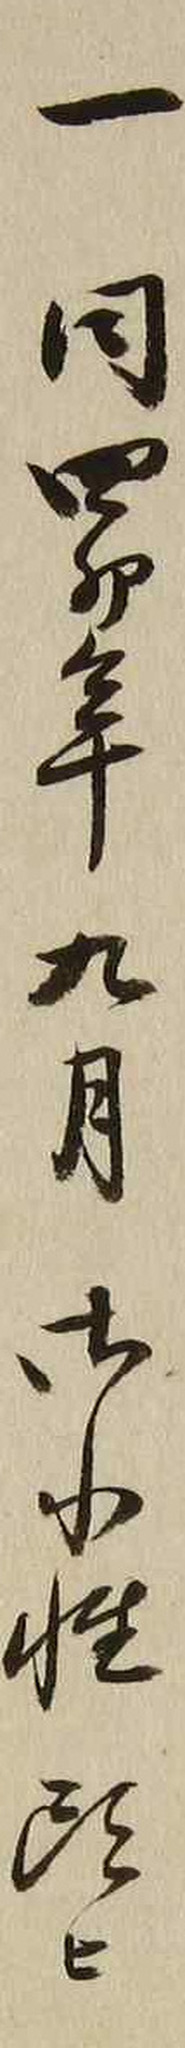一同四卯年九月御小性頭被
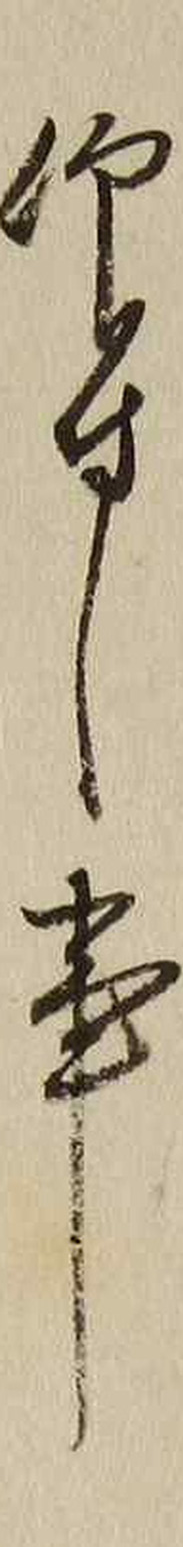仰付候事
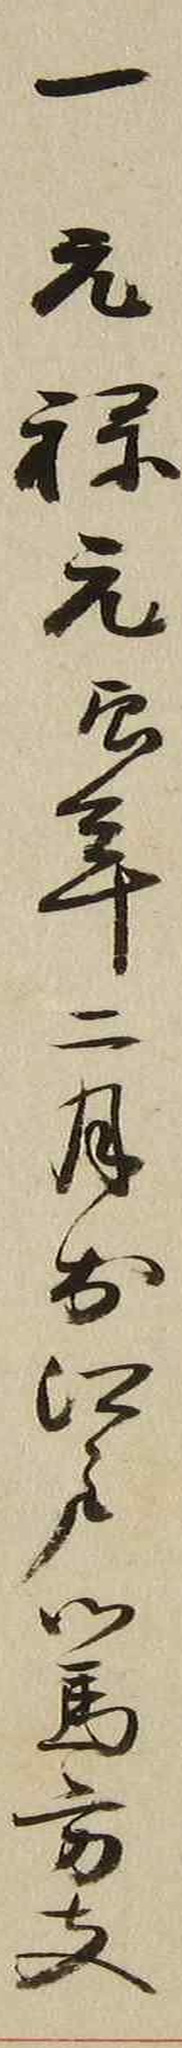一元禄元辰年二月於江戸御馬方支
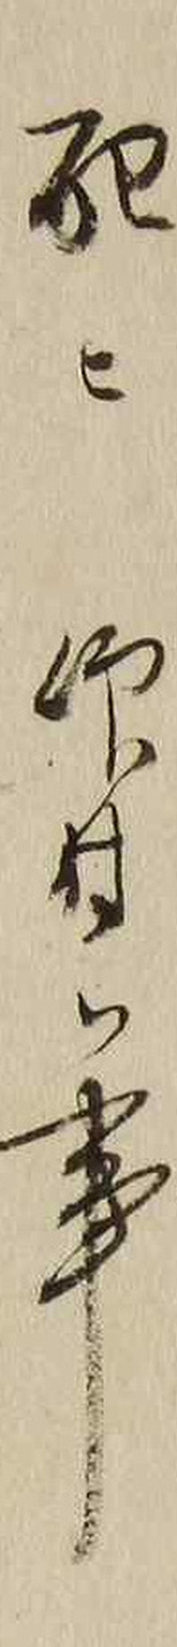配被仰付候事
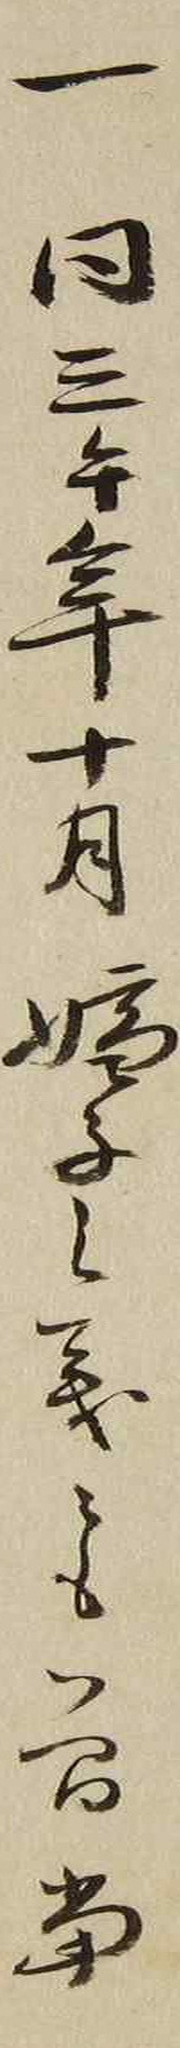一同三午十月嫡子之義にも候間当
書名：諸士系譜　巻之269　さ之部1
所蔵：会津若松市立会津図書館
